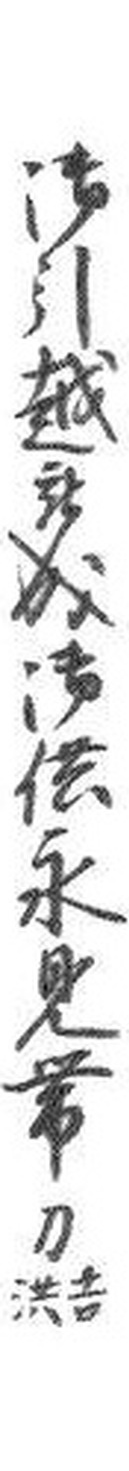御引越被成御供永見帯刀吉洪
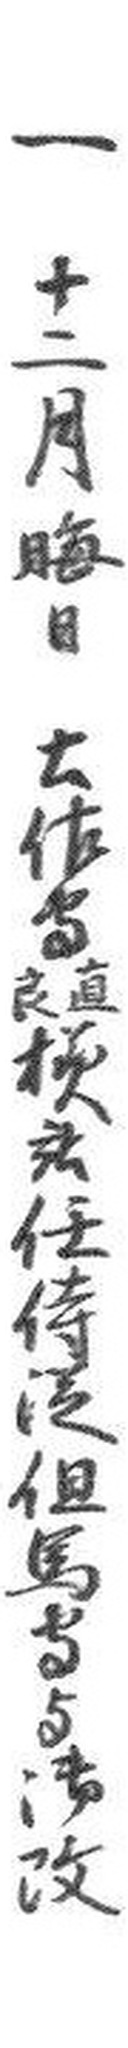一十二月晦日土佐守直良様被任侍従但馬守与御改
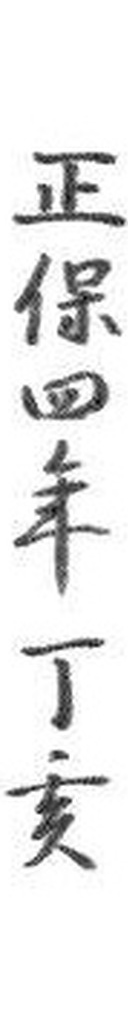正保四年丁亥
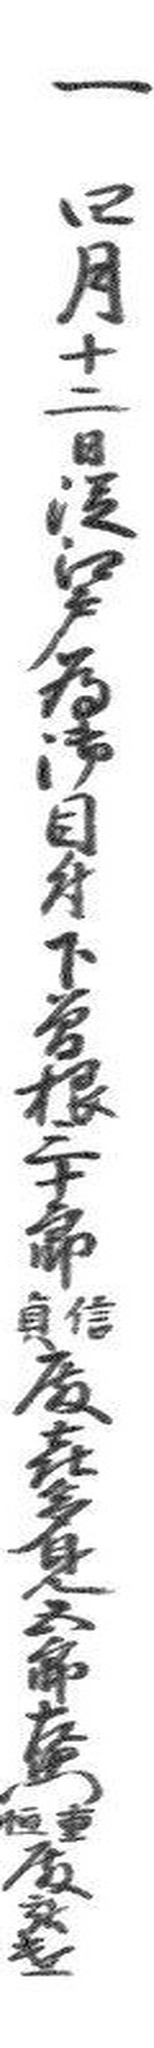一四月十二日従江戸為御目付下曾根三十郎信貞殿喜多見五郎左衛門重恒
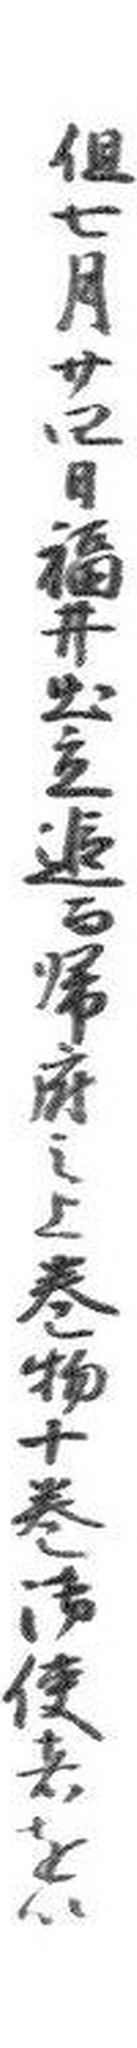但七月廿四日福井出立追而帰府之上巻物十巻御使者を以
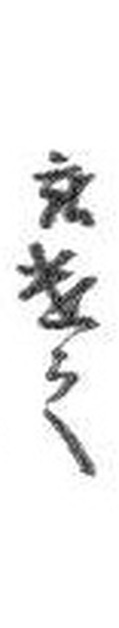被遣之
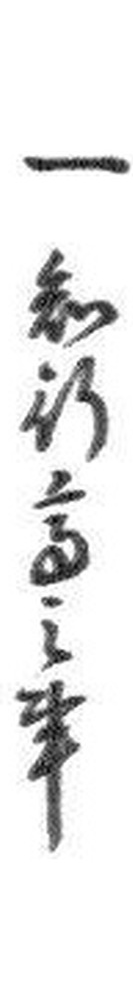一知行高之事

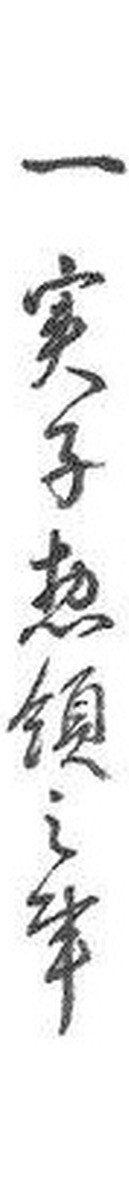一実子惣領之事
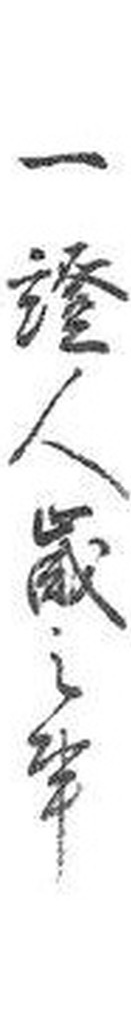一証人歳之事
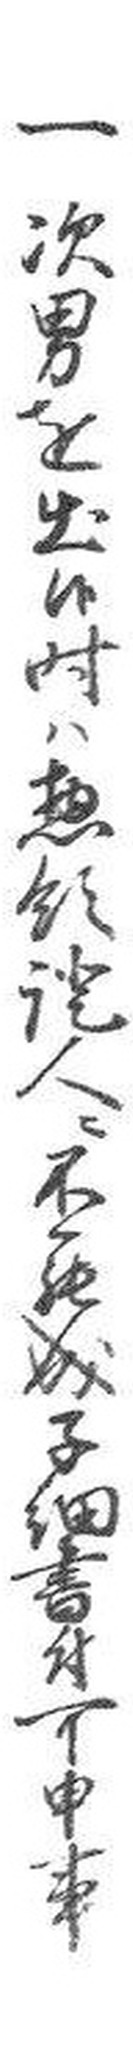一次男を出候時ハ惣領証人ニ不罷成子細書付可申事
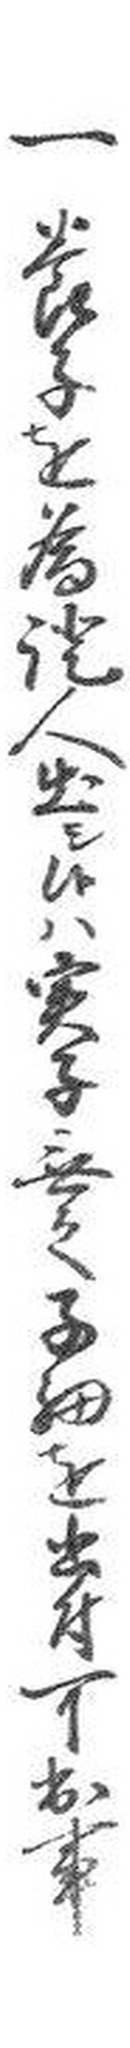一養子を為証人出シ候ハ実子無之子細を書付可出事
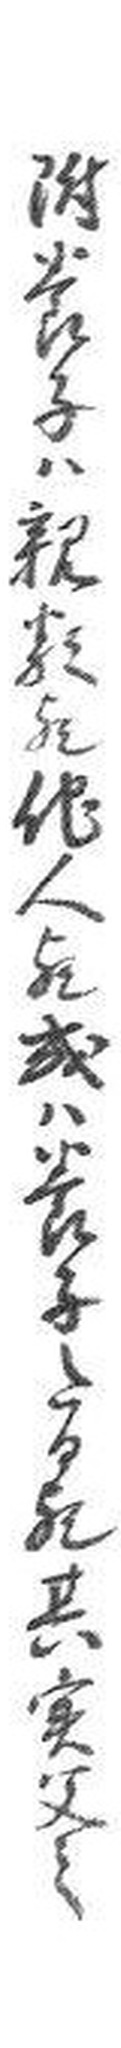附養子ハ親類歟他人歟或ハ養子たる歟其実父之
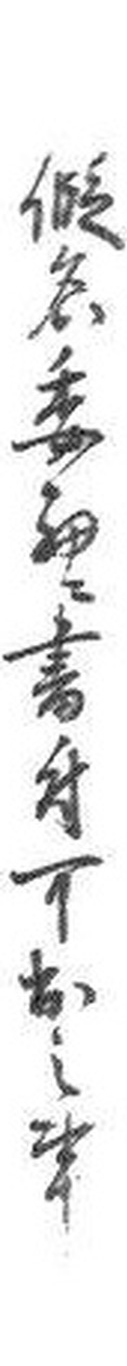仮名委細ニ書付可出之事
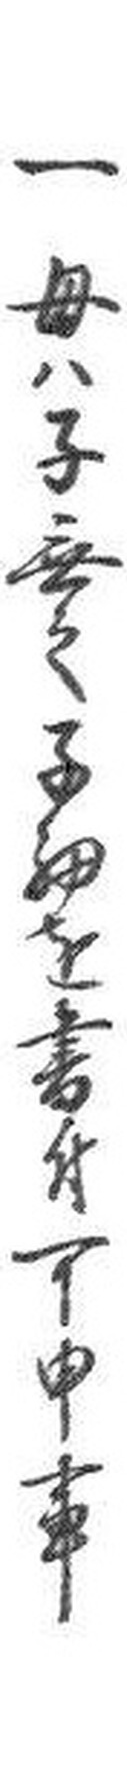一母ハ子無之子細を書付可申事
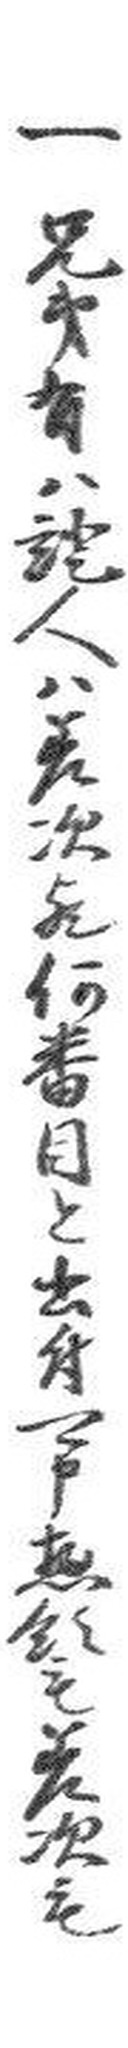一兄弟有ハ証人ハ差次歟何番目と書付可申惣領も差次も
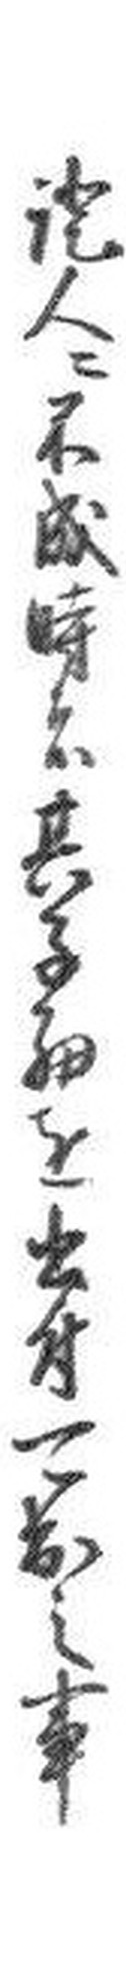証人ニ不成時者其子細を書付可出之事
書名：家譜 五 光通公 従寛永十三年到万治二年
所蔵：福井県文書館 Fukui Prefectural Archives
